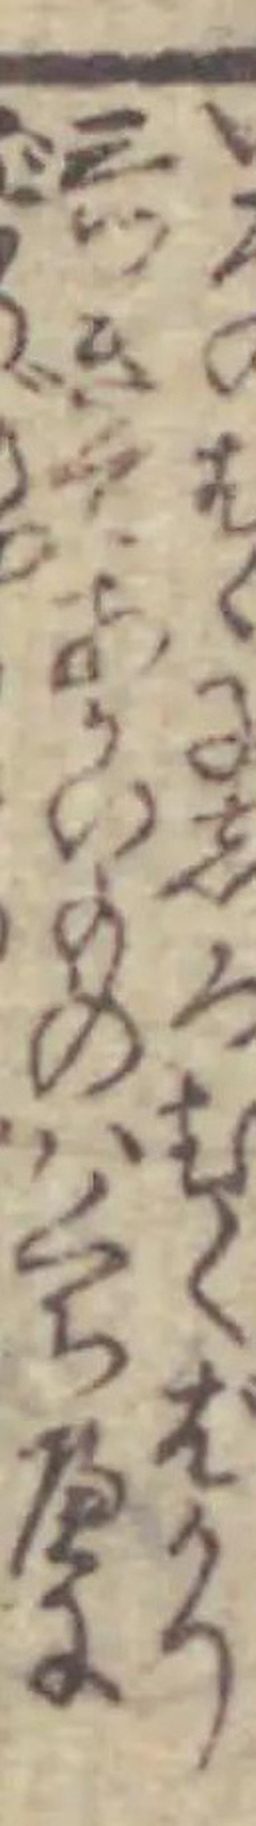三つきてあかいものはくちへに
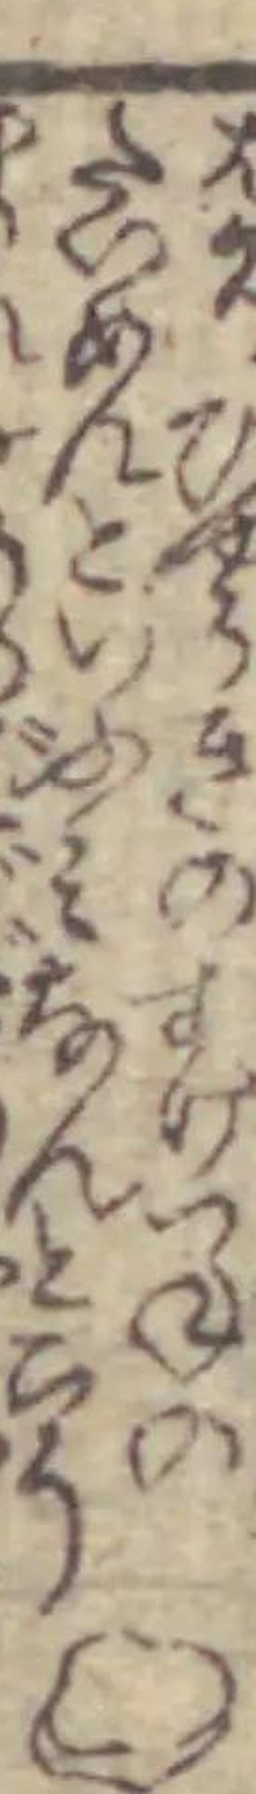たいめんといふみなんとこう
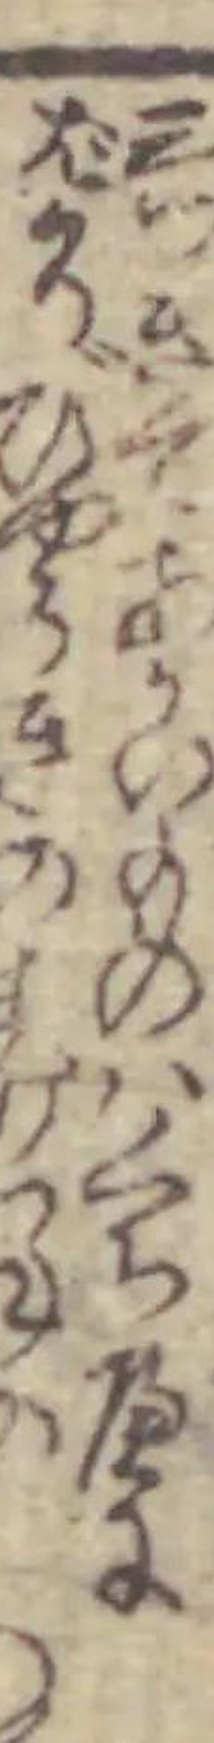ばかりびやうきのすけつねの
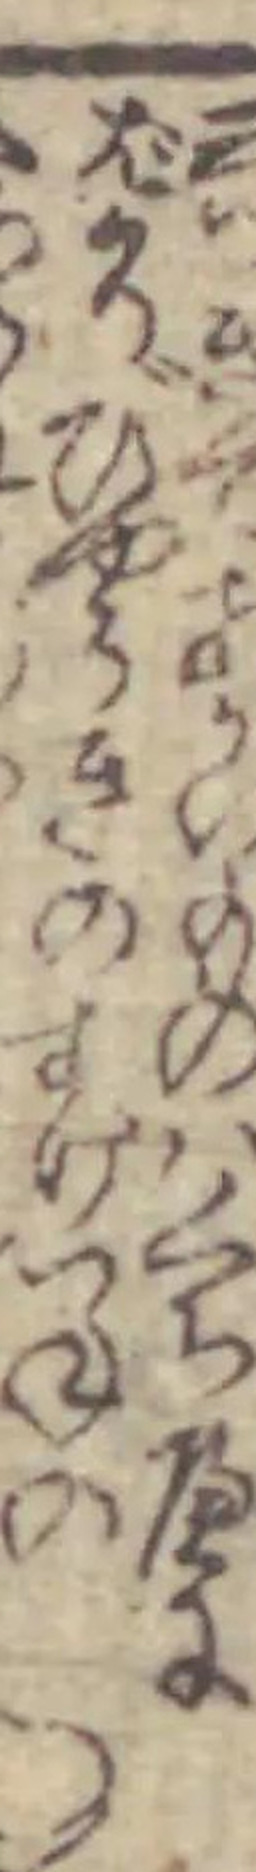ばかりびやうきのすけつねの
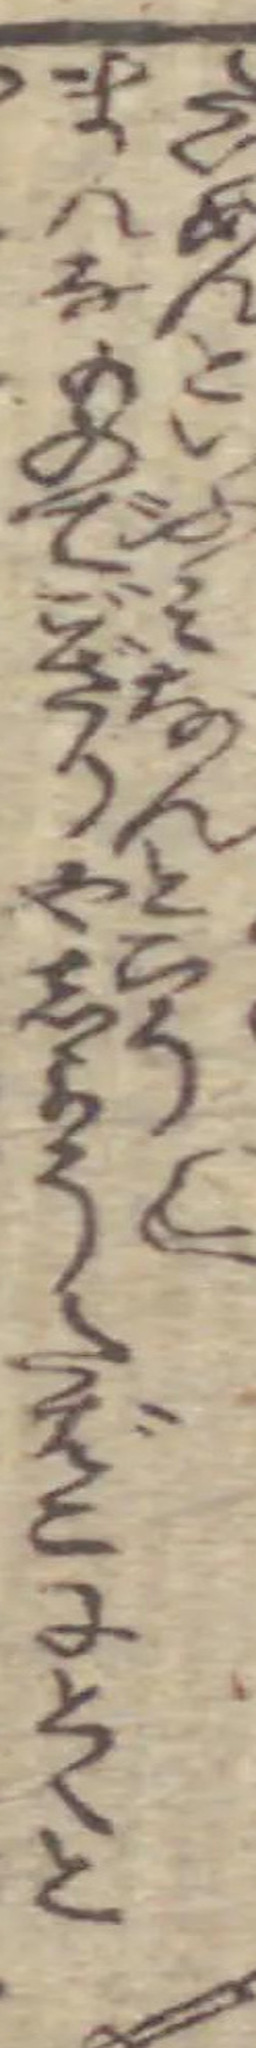まんなものでござりやしようたばこにとくと
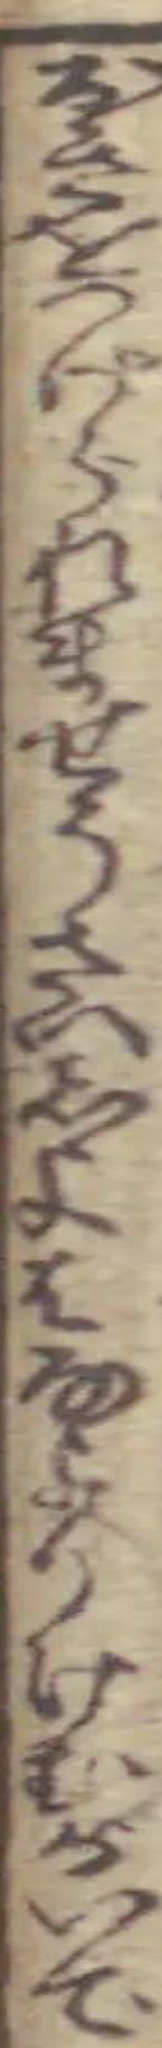おきをつけられませうさいしよはなよりけむがいで
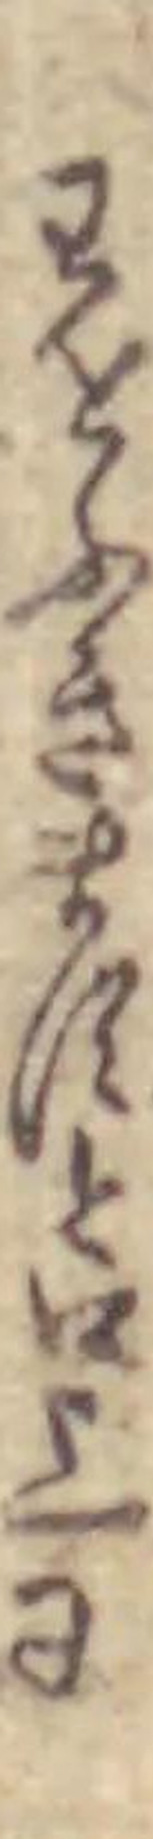わをふきますと口上に
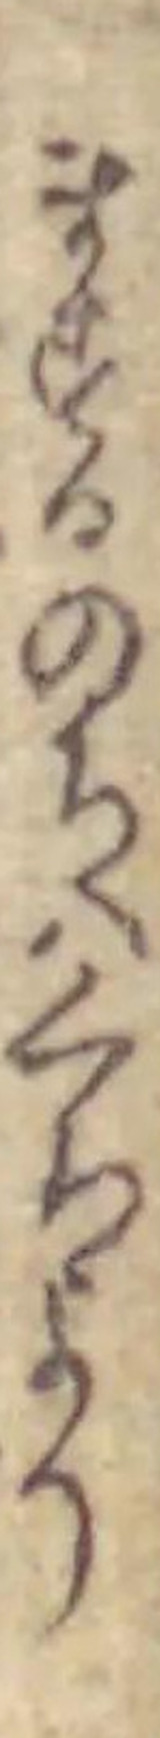まするのちはくちより
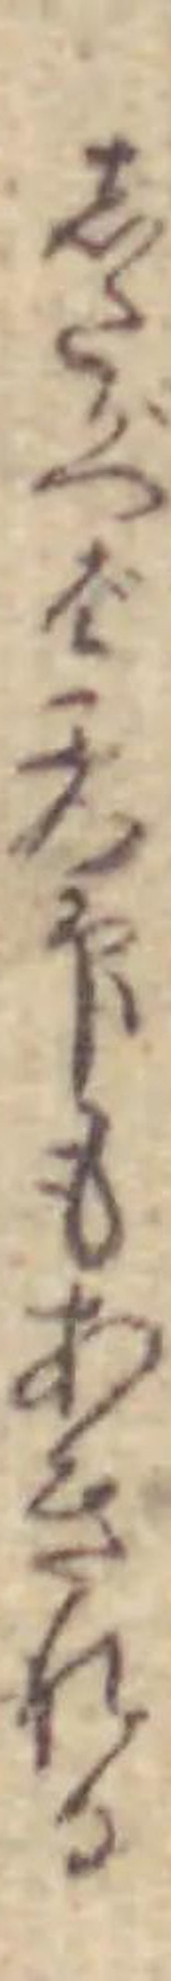したがへば天印もあきれる
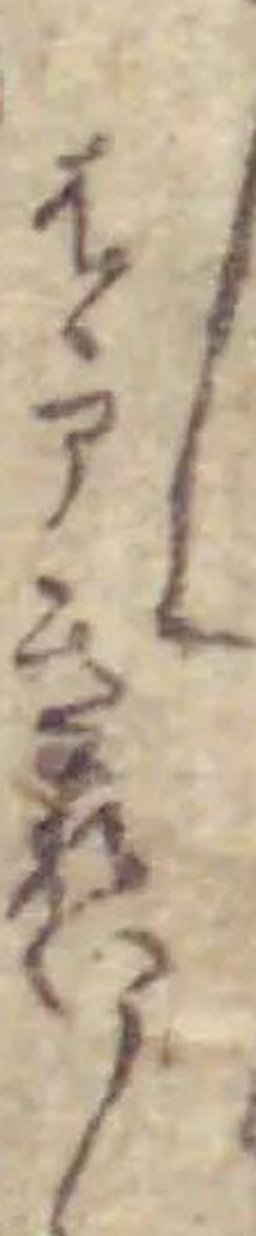はゝアきれい〳〵

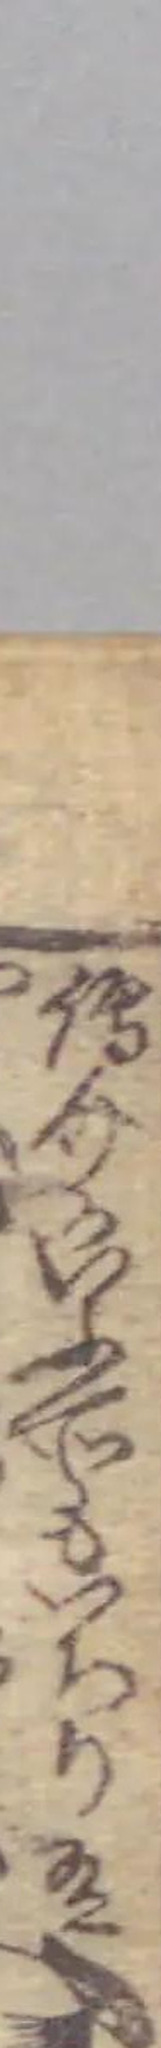伝介かいふ所もいちり有
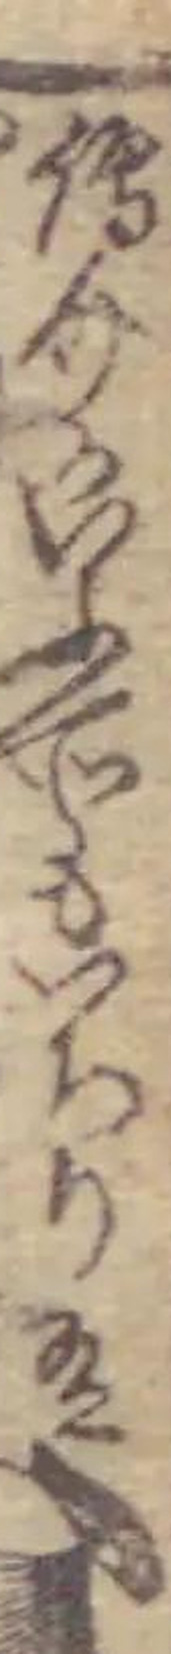伝介かいふ所もいちり有
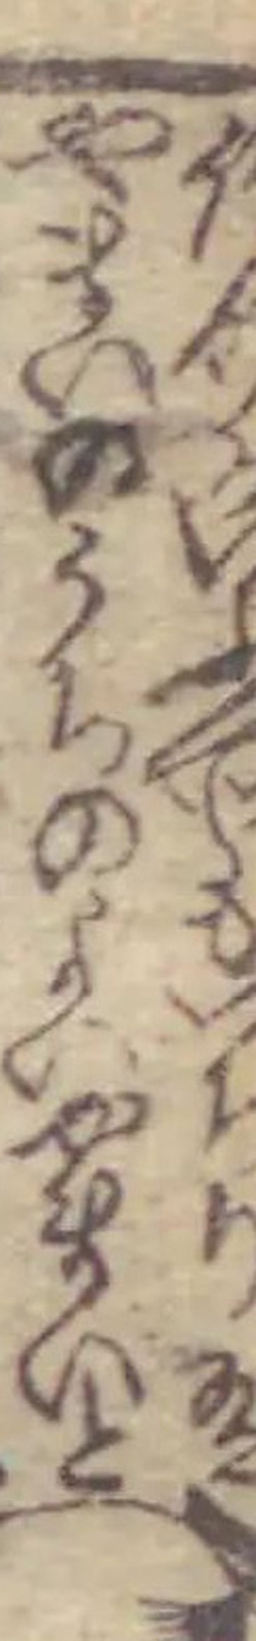やまいのうちのよいやまいと
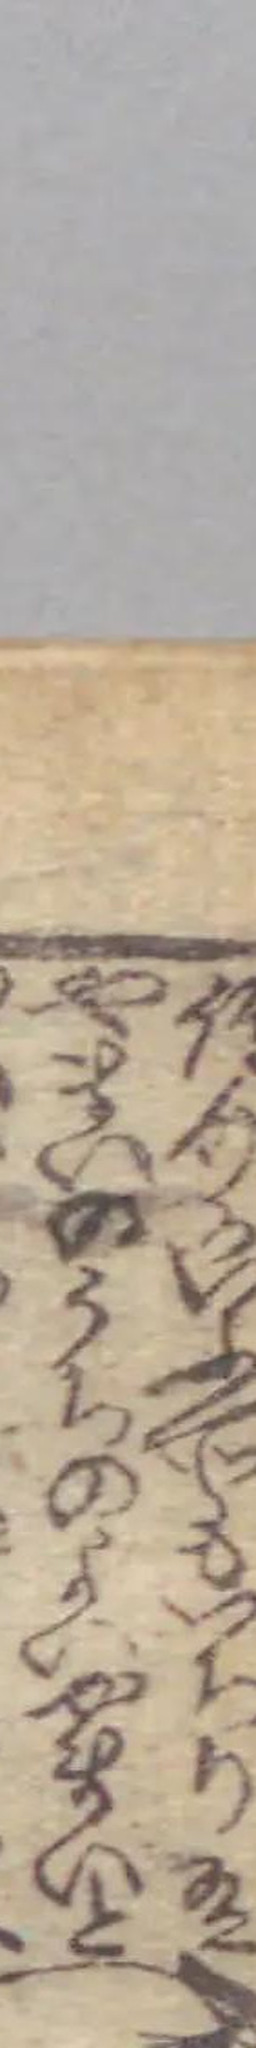やまいのうちのよいやまいと
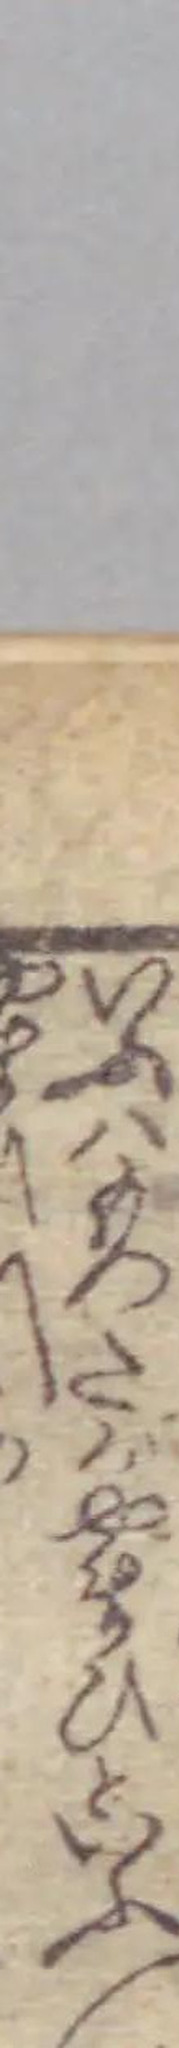いふはもつたがやまひといふ
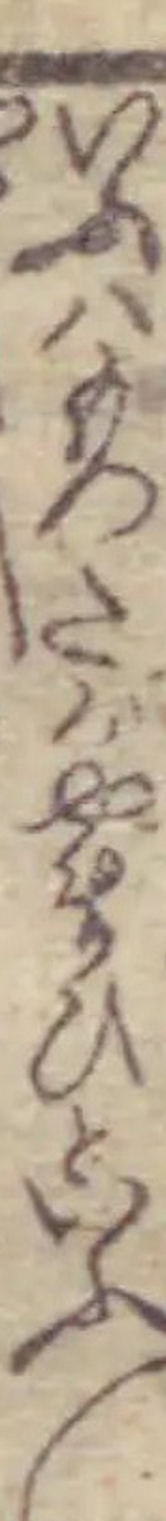いふはもつたがやまひといふ
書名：珍説女天狗 2巻
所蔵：国立国会図書館 National Diet Library, JAPAN
